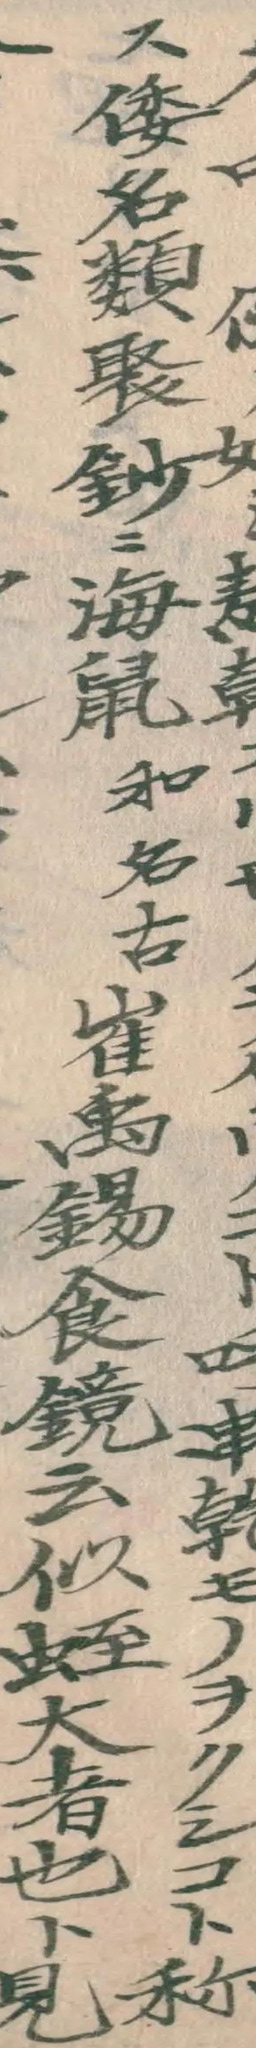ス倭名類聚鈔ニ海鼠和名古崔禹錫食鏡云似蛭大者也ト見
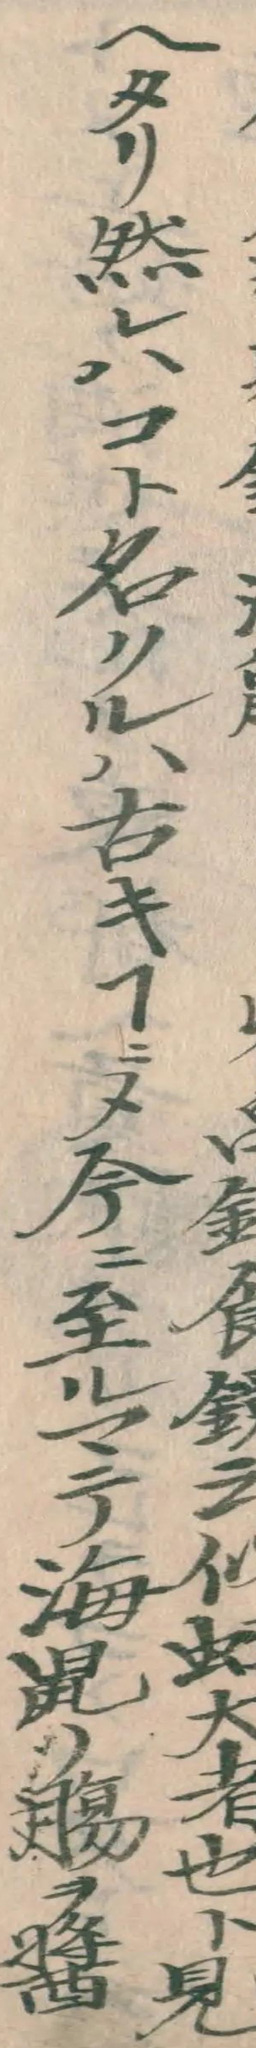ヘタリ然レハコト名クルハ古キコトニシテ今ニ至ルマテ海鼠ノ腸ヲ醤

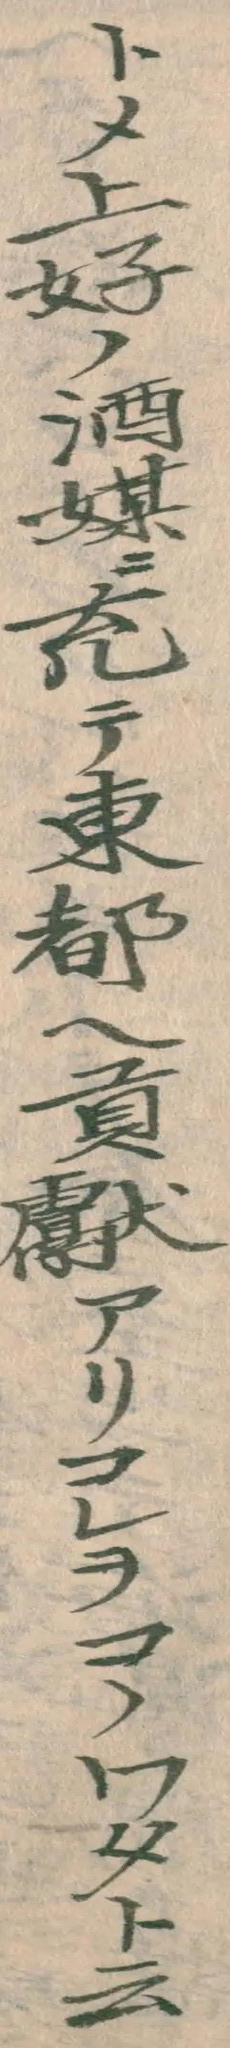トシテ上好ノ酒媒ニ充テ東都ヘ貢献アリコレヲコノワタト云
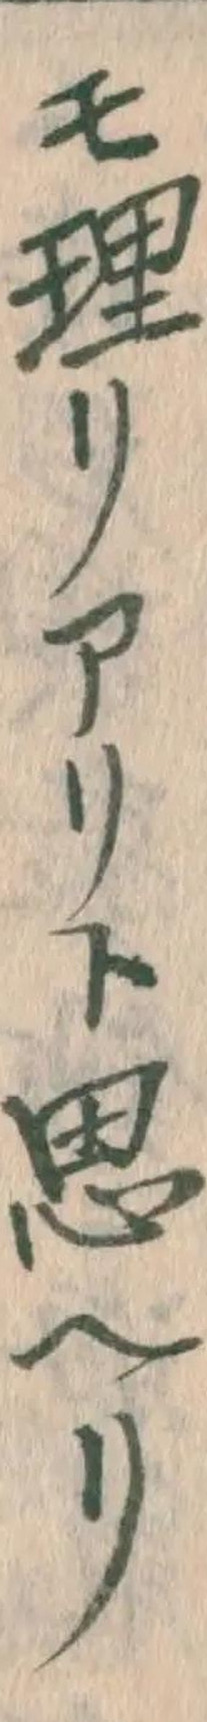モ理リアリト思ヘリ
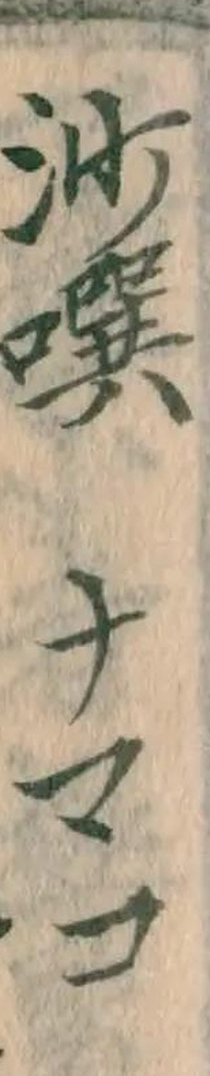沙噀ナマコ
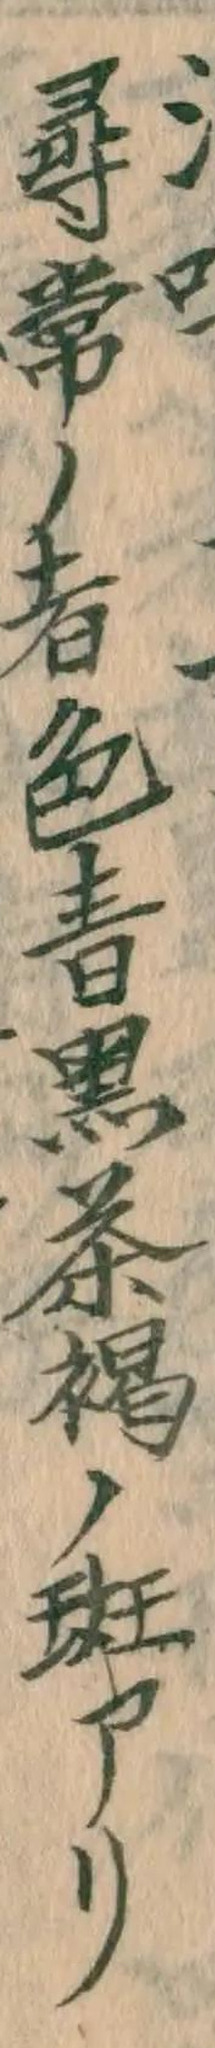尋常ノ者色青黒茶褐ノ斑アリ
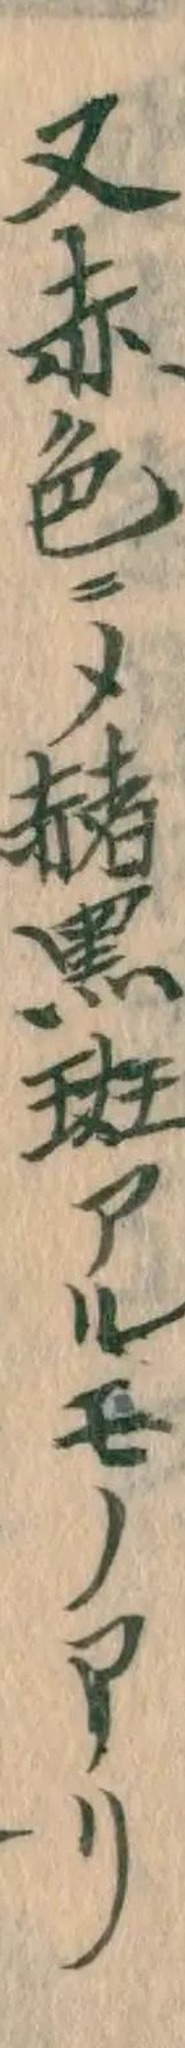又赤色ニシテ赭黒斑アルモノアリ
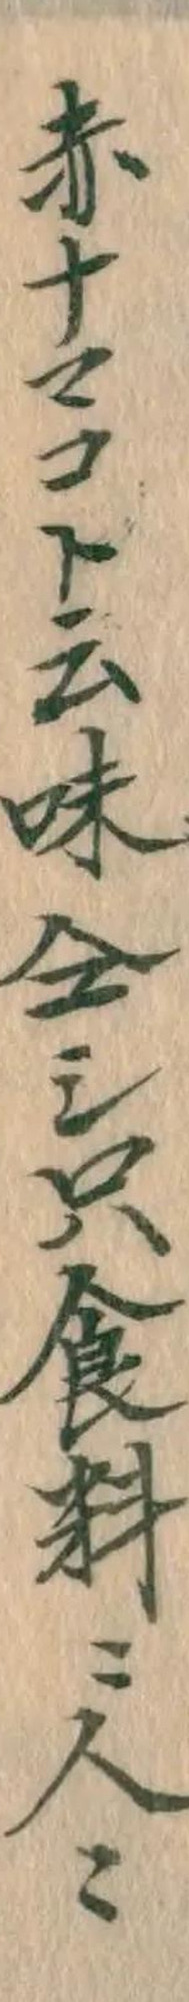赤ナマコト云味仝シ只食料ニ人々
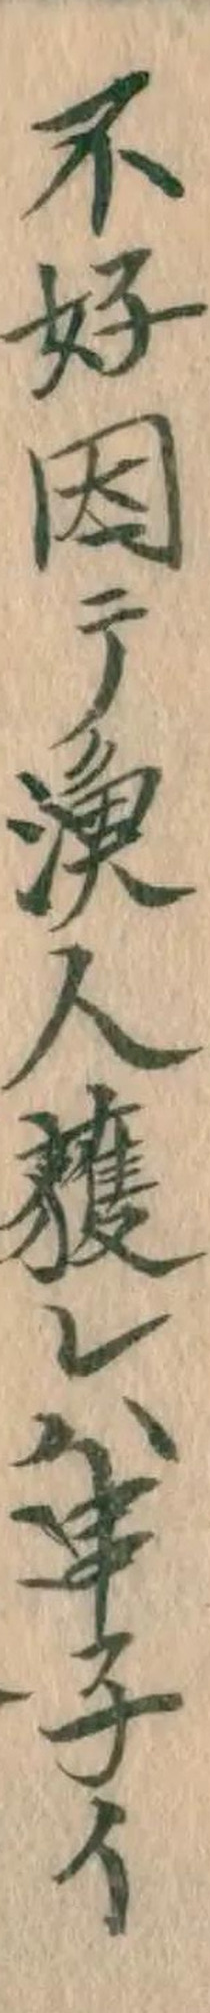不好因テ漁人獲レハ串子イ
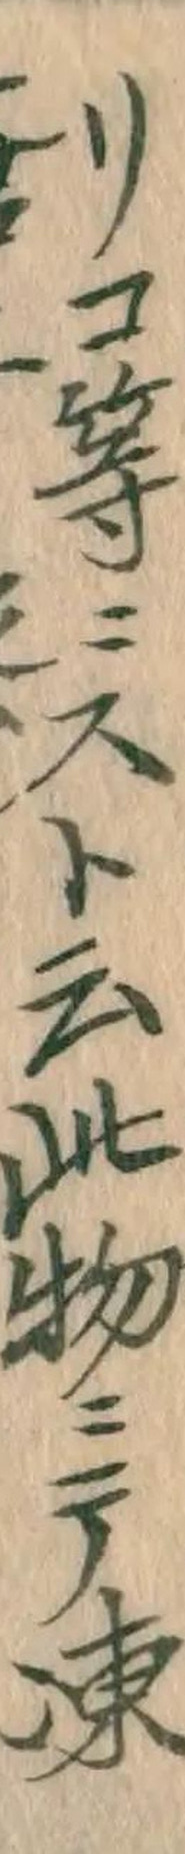リコ等ニスト云此物ニテ凍
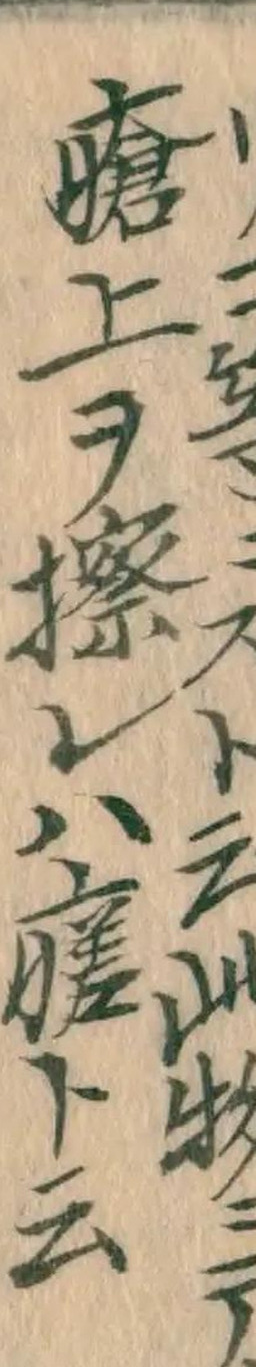瘡上ヲ擦レハ瘥ト云

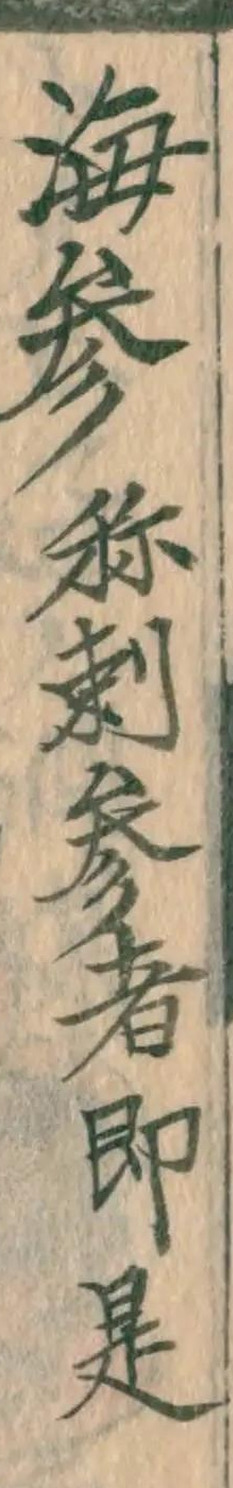海参称刺参者即是
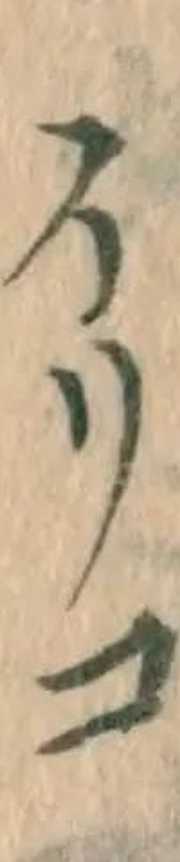イリコ
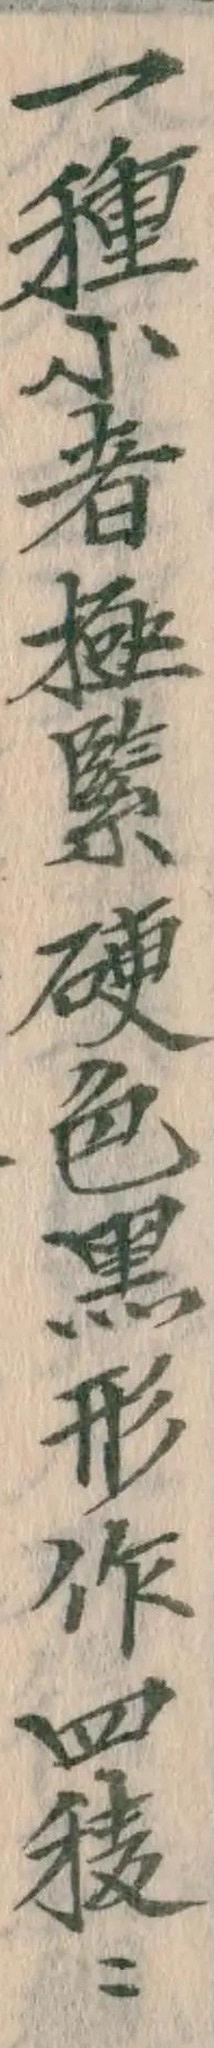一種小者極𦂳硬色黒形作四稜ニ
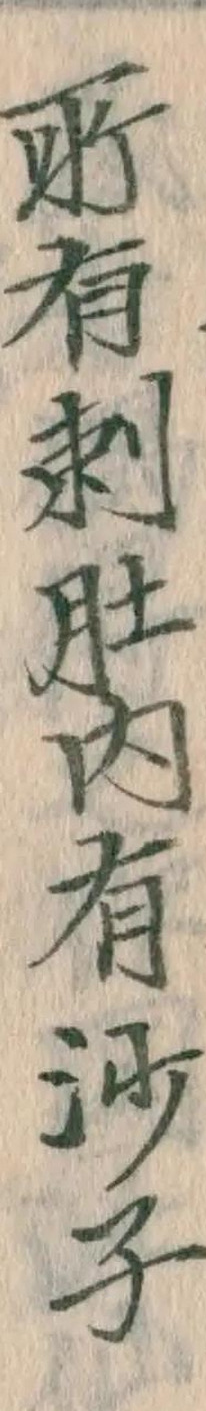所有刺肚内有沙子

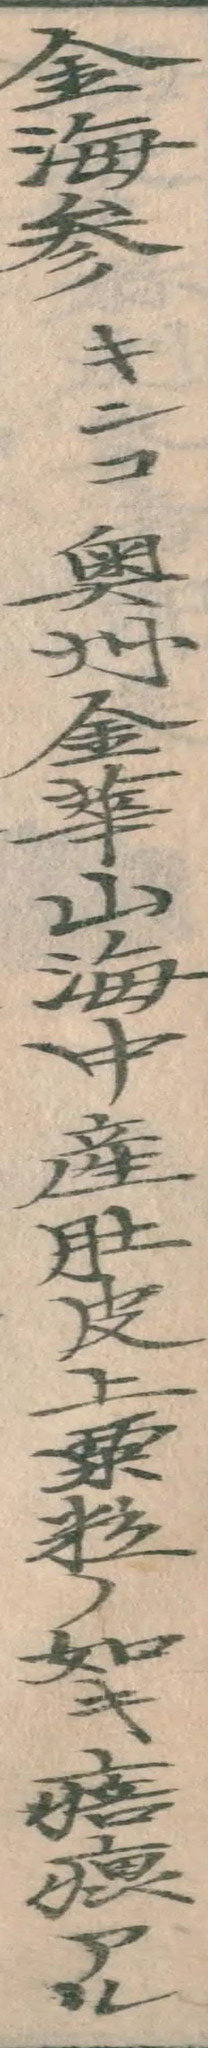金海参キンコ奥州金華山海中産肚皮上粟粒ノ如キ㾦㿔アル
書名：千蟲譜 3巻. [3]
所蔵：国立国会図書館 National Diet Library, JAPAN
